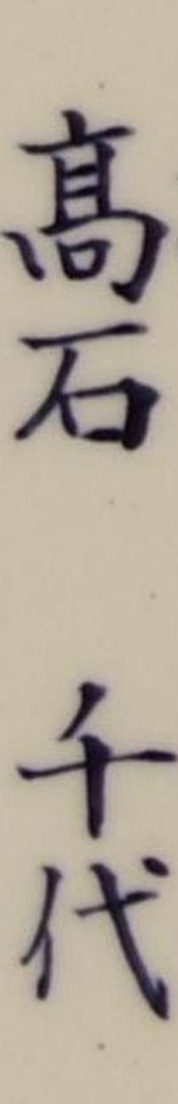高石千代
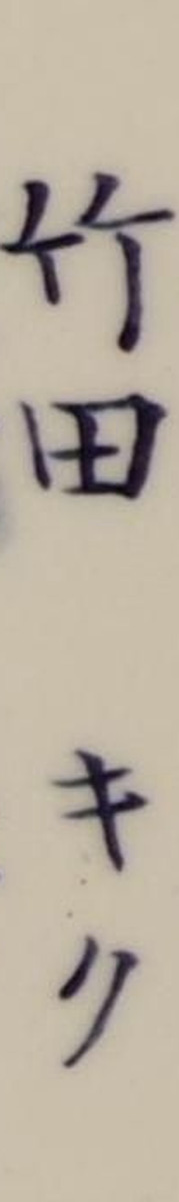竹田キク

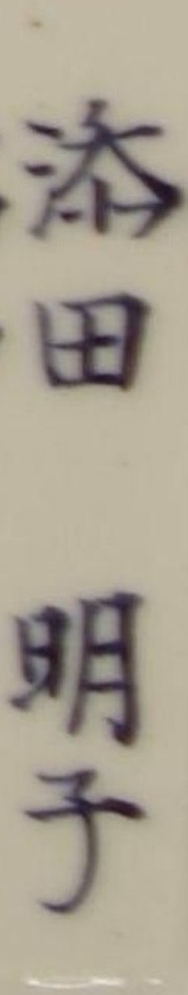添田明子
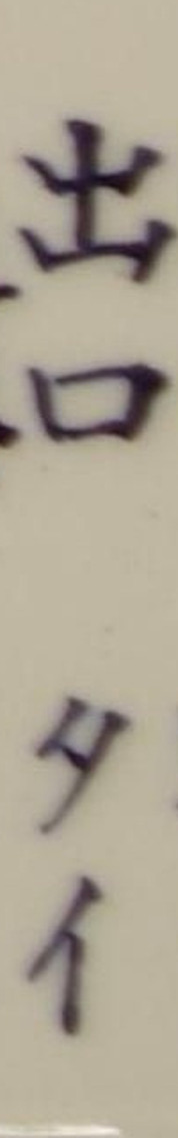出口タイ
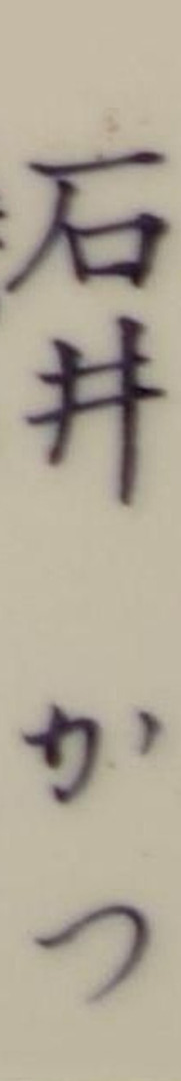石井かつ
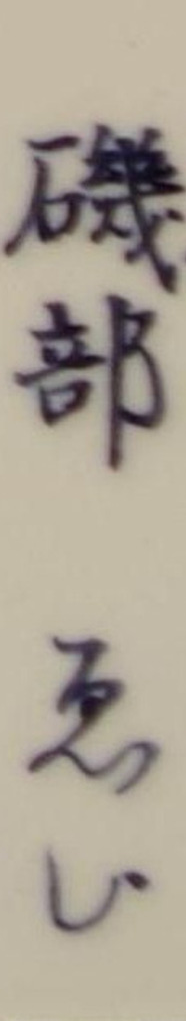磯部ゑい
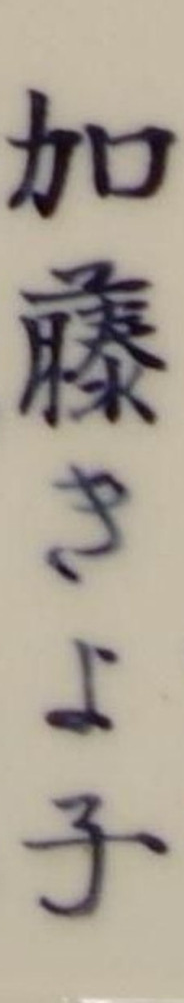加藤きよ子
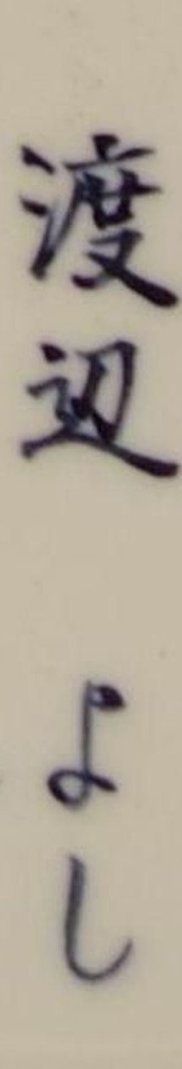渡辺よし
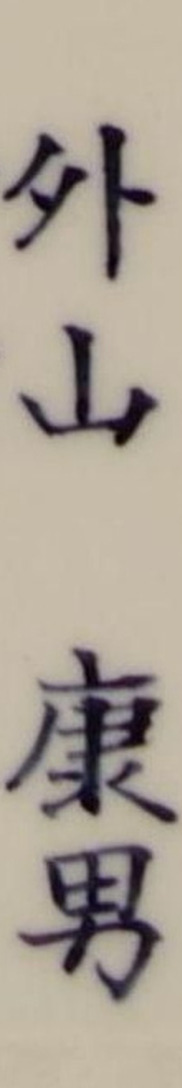外山康男
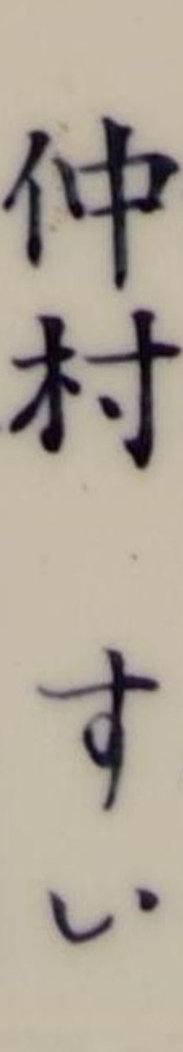仲村すい
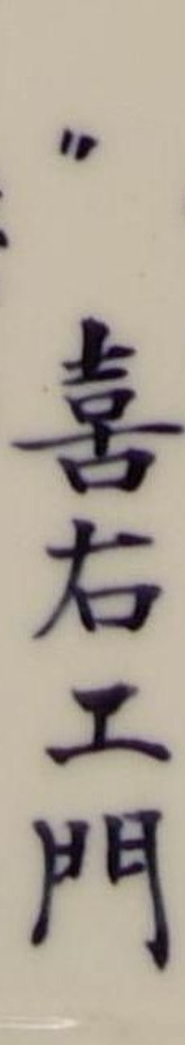喜右衛門
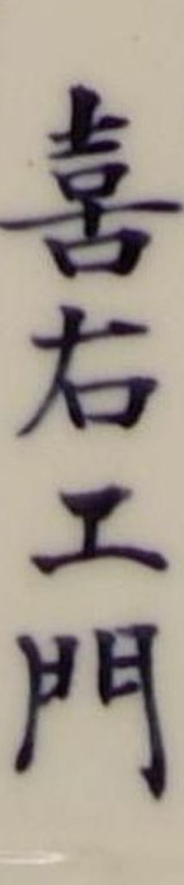喜右衛門
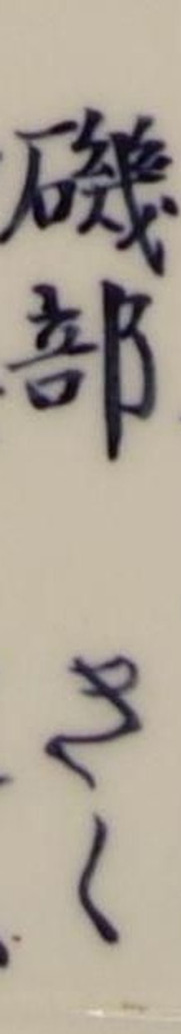磯部きく
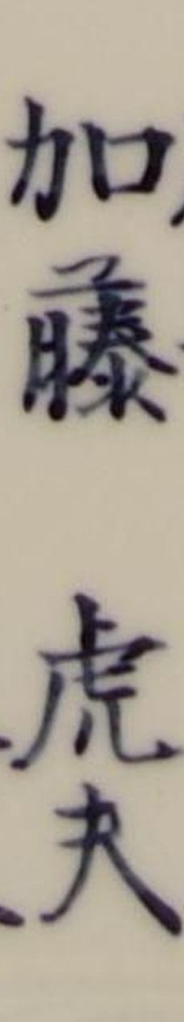加藤虎夫
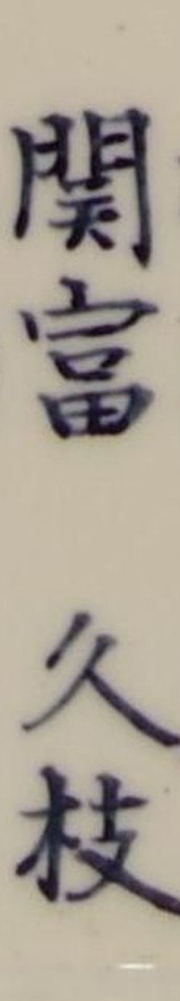関富久枝
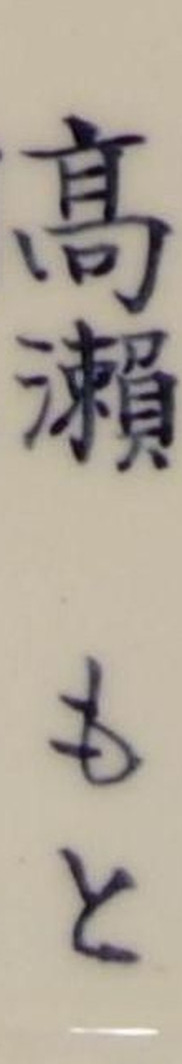高瀬もと
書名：M~S
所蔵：高野山金剛峯寺
